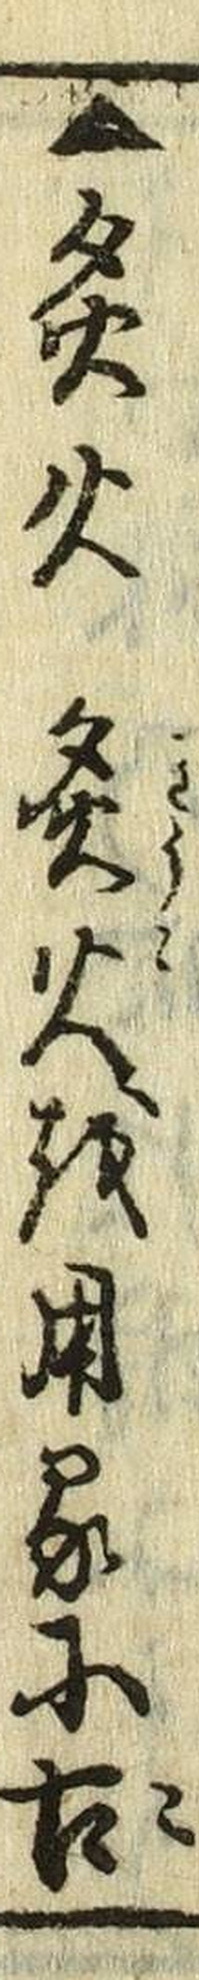▲灸火灸火を用るに古
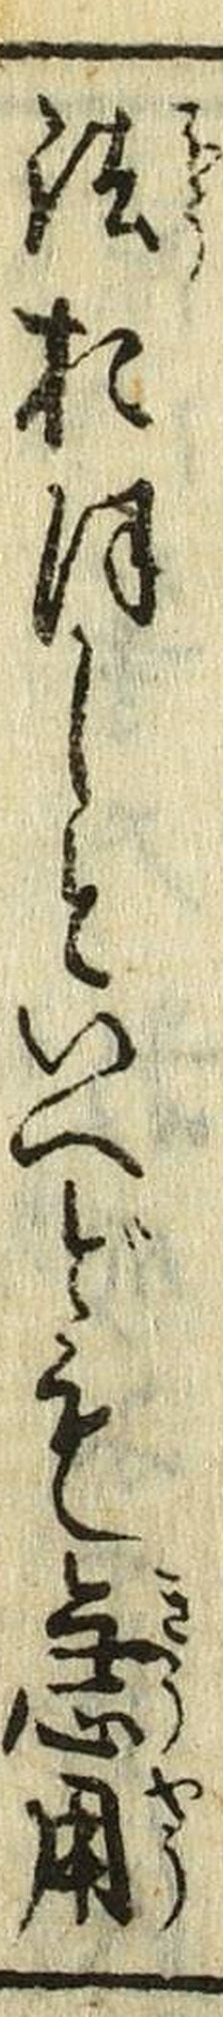法おほしといへども急用
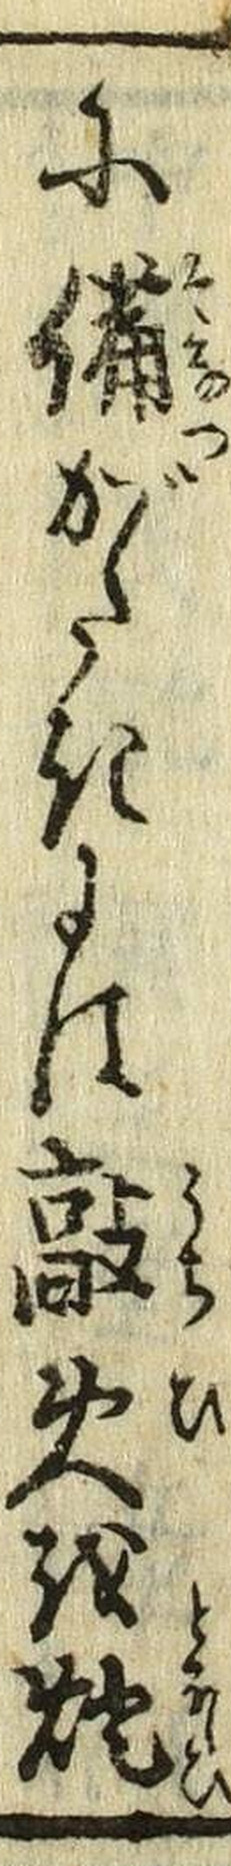に備がたきには敲火を灯
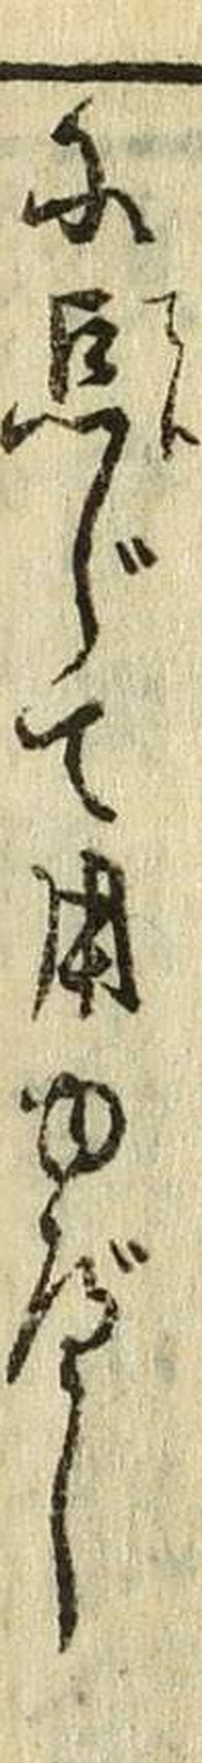に点じて用ゆべし
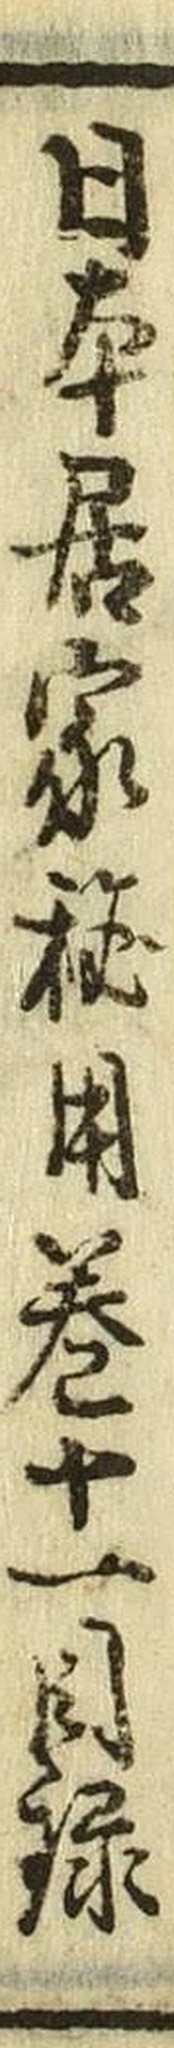日本居家秘用巻十一目録
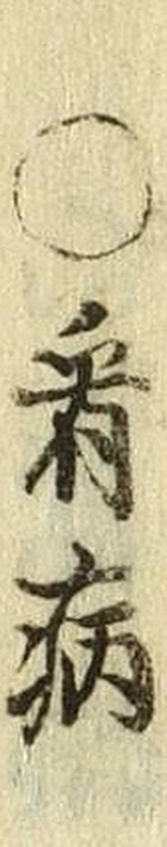○看病
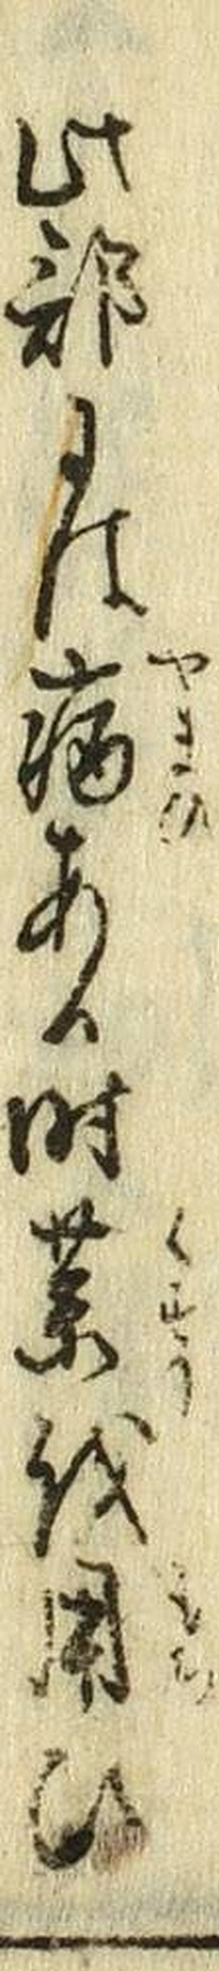此部には病ある時薬を用ひ
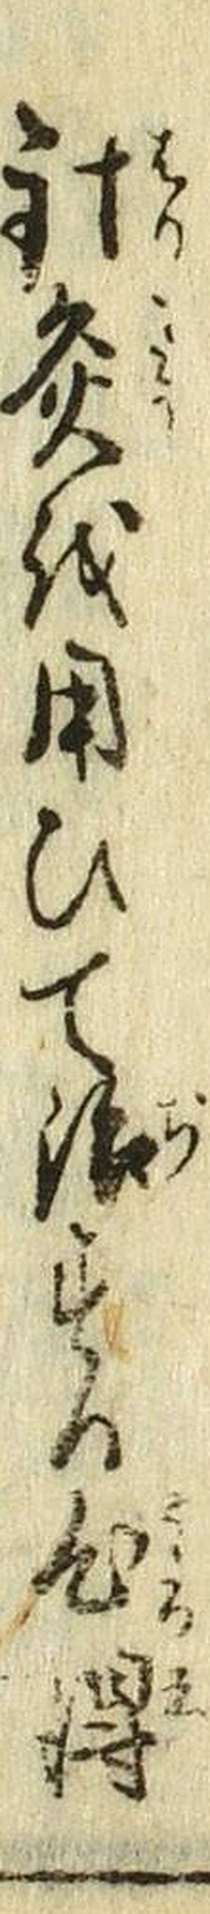針灸を用ひて治する心得
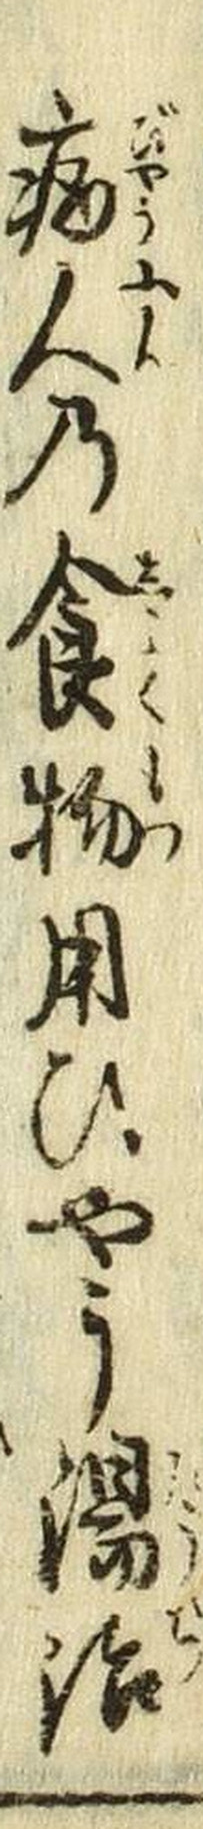病人の食物用ひやう湯治
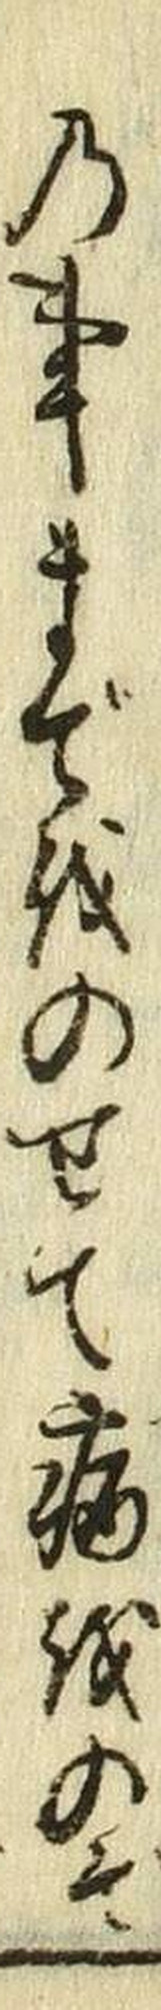の事までをのせて病をのぞ
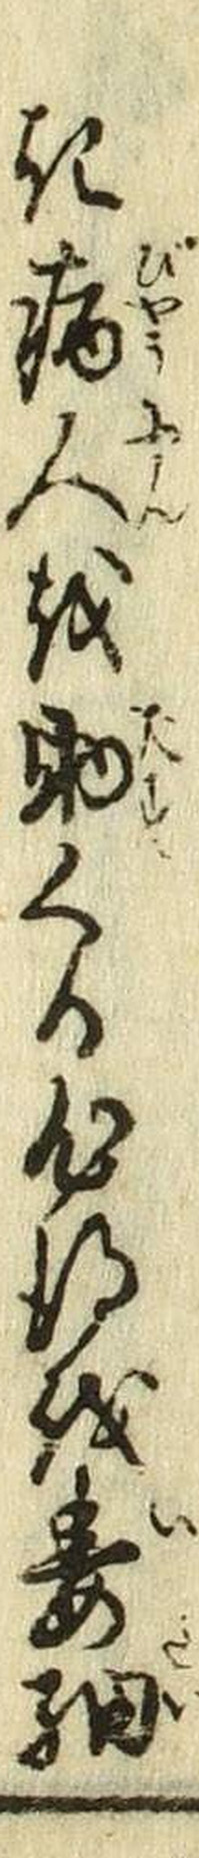き病人を助くる心得を委細
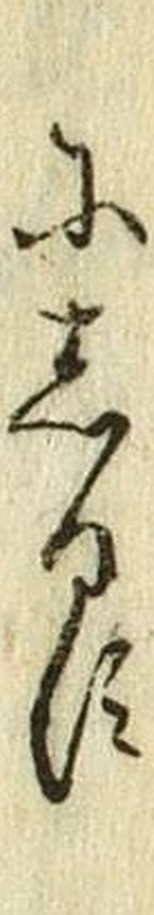にしるす
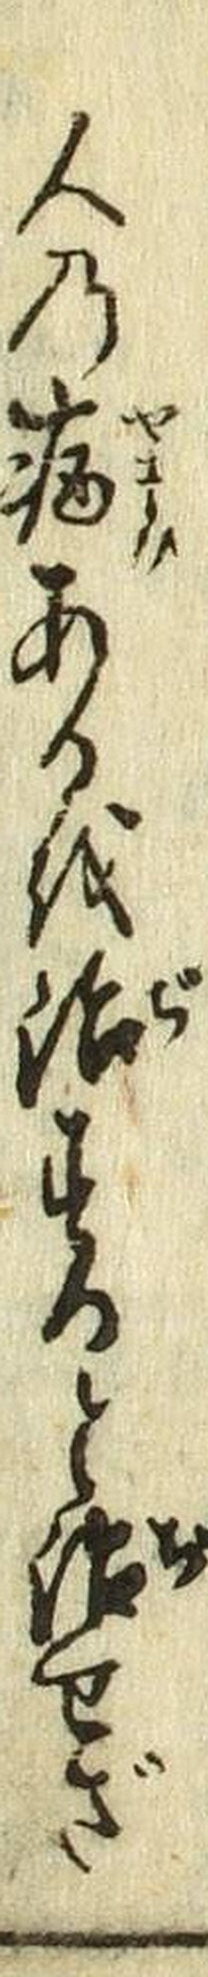人の病あるを治すると治せざ
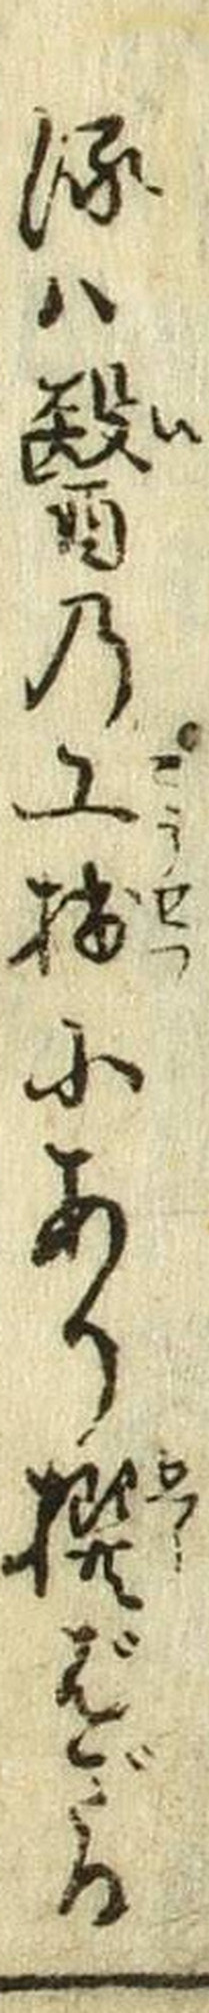るは医の工拙にあり撰ばざる
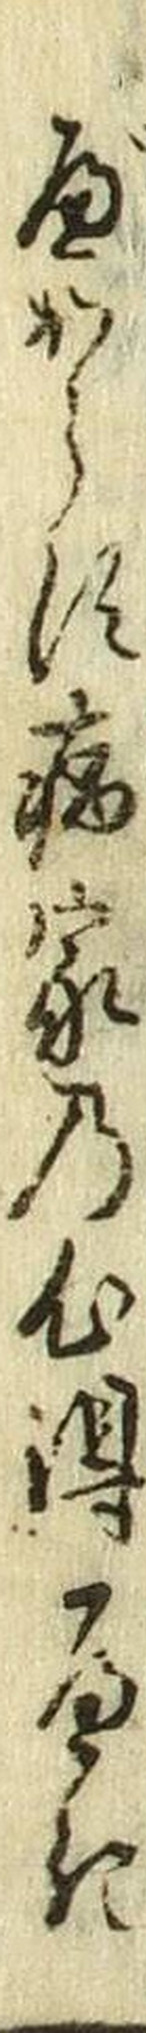べからす病家の心得べき
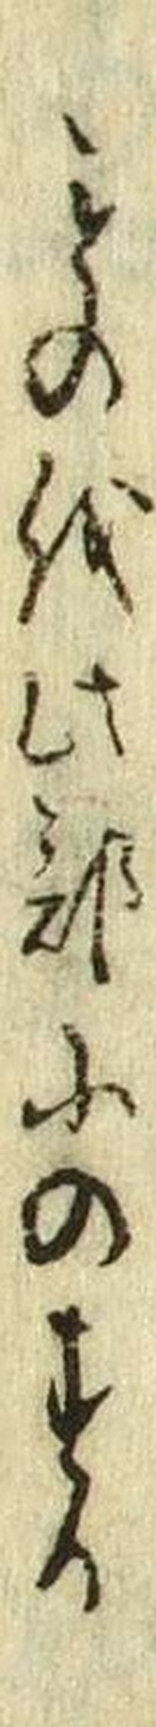ものを此部にのする
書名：居家養生記
